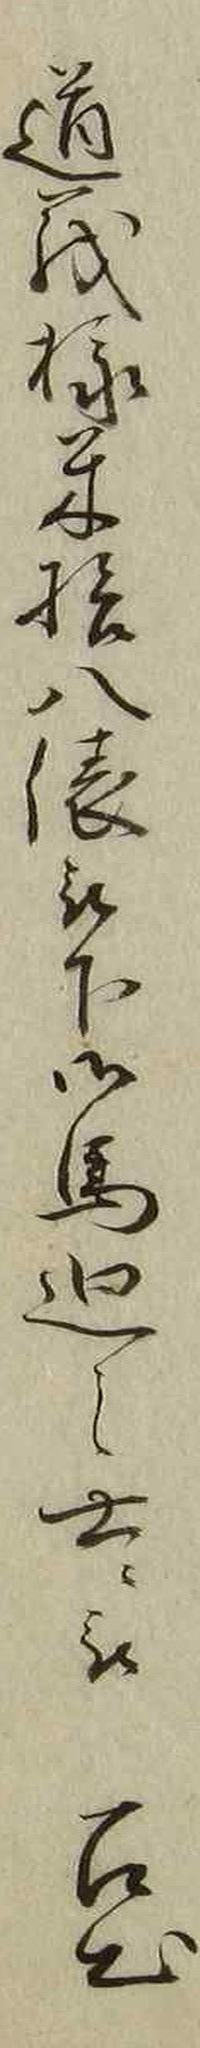道義様米拾八俵被下御馬廻之士ニ被召出
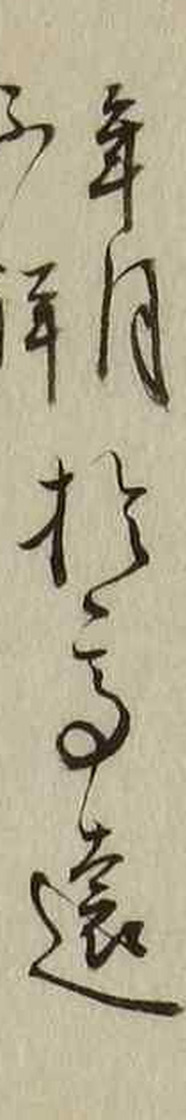不詳於高遠
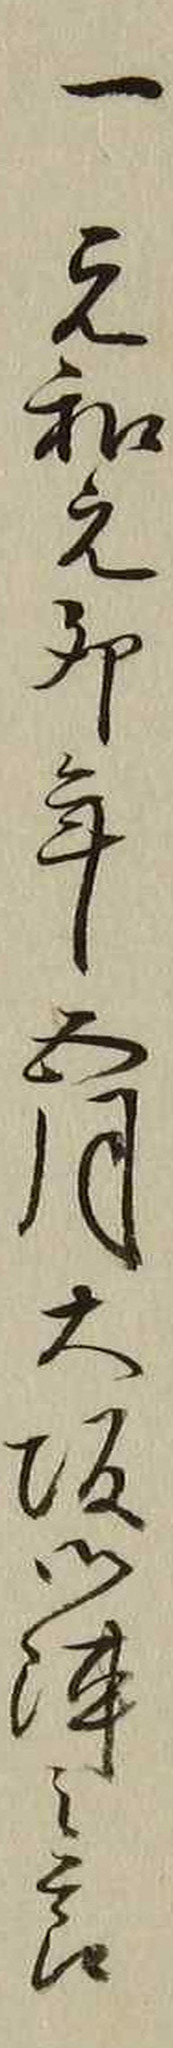一元和元卯年五月大坂御陣之節
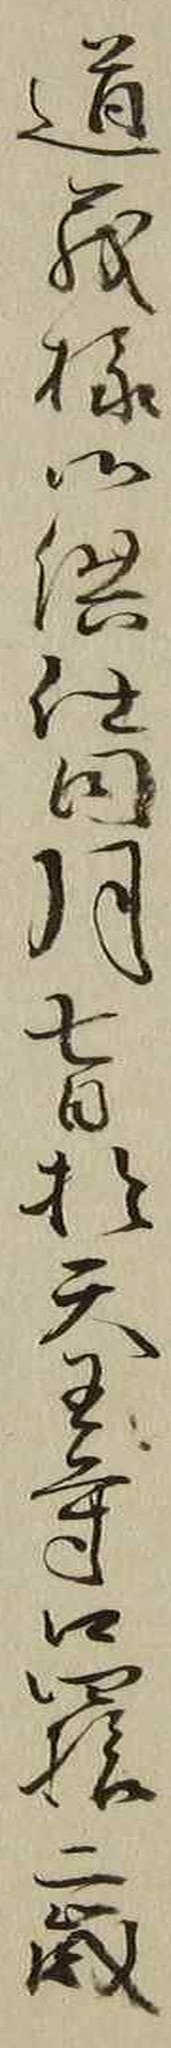道義様御供仕同月七日於天王寺口四拾二歳
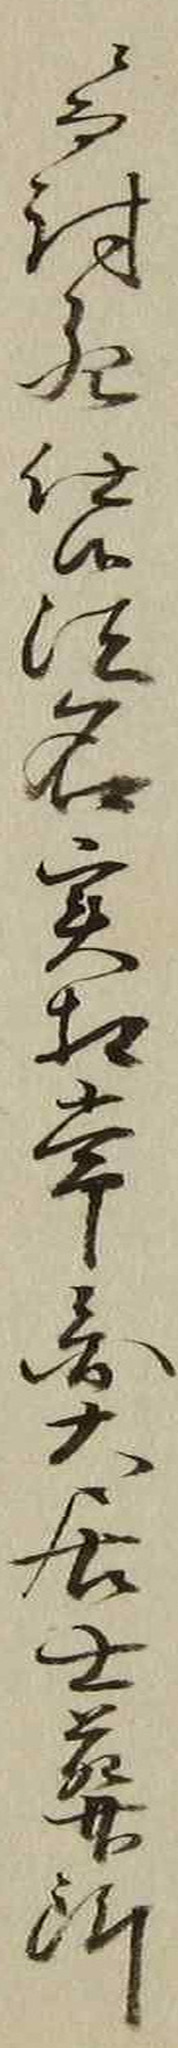ニ而討死仕候法名実相常円大居士葬所
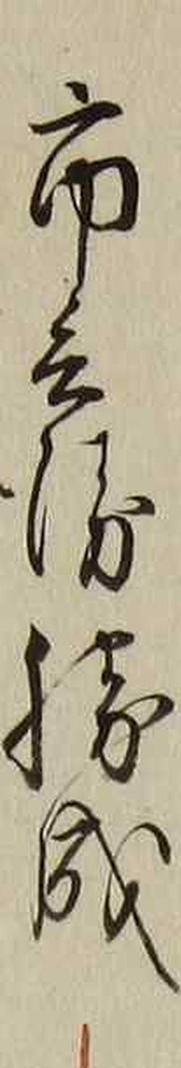市兵衛勝成
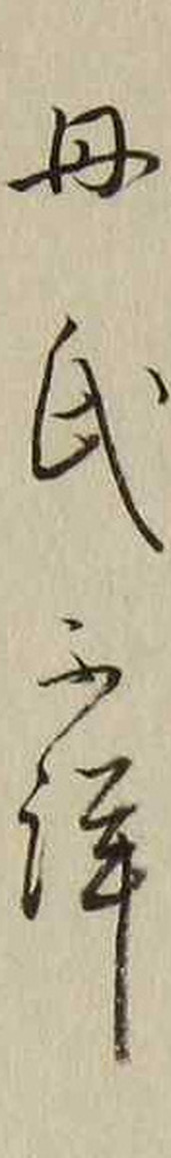母氏不詳
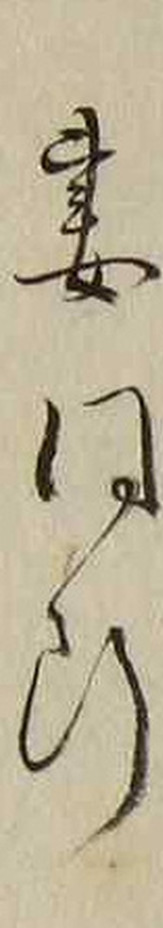妻同断
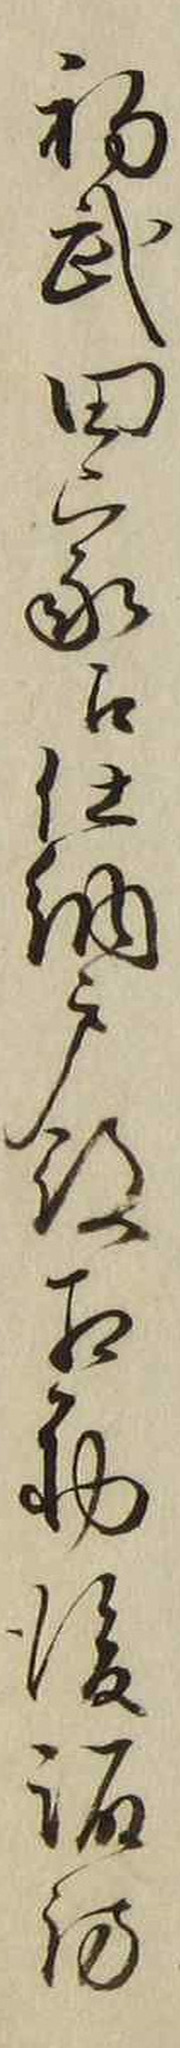初武田家江仕納戸役相勤後諏訪

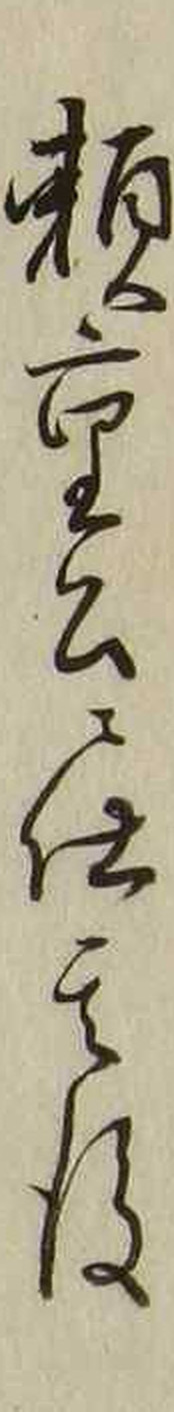頼重公ニ仕其後
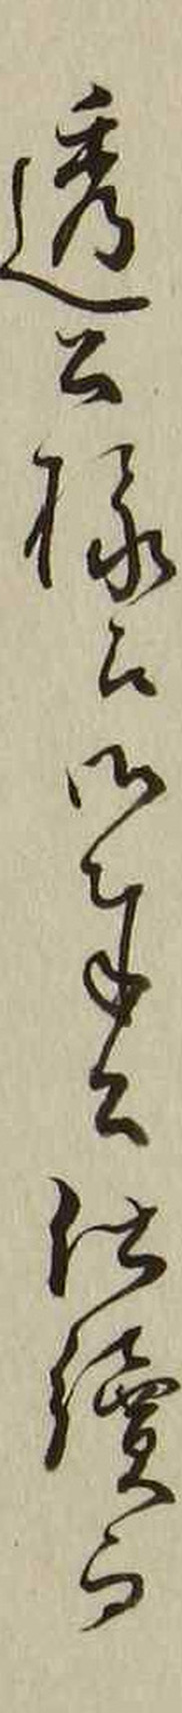透公様江御奉公仕続而
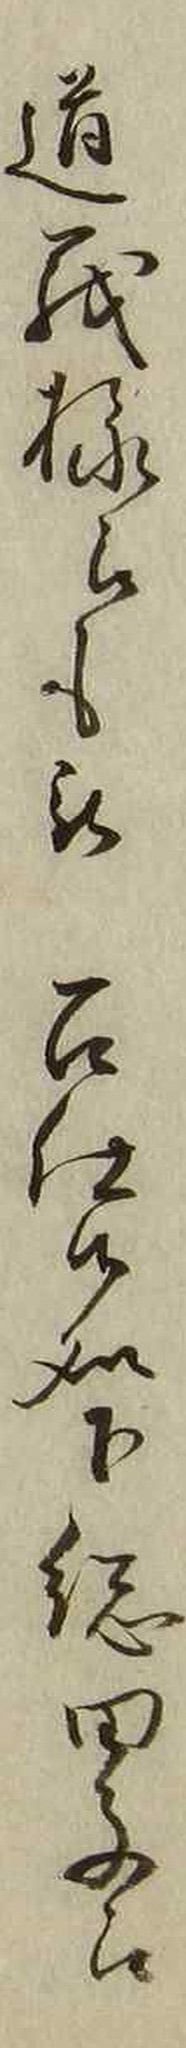道義様江も被召仕候処下総田子江
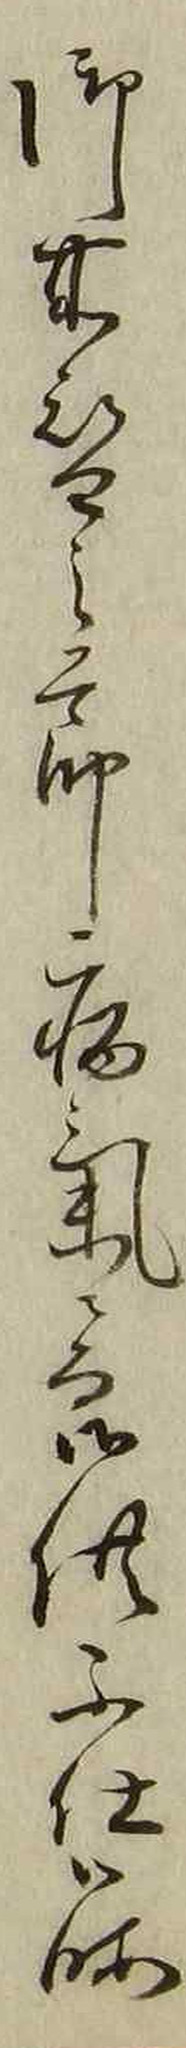御所替之節病気ニ而御供不仕御暇
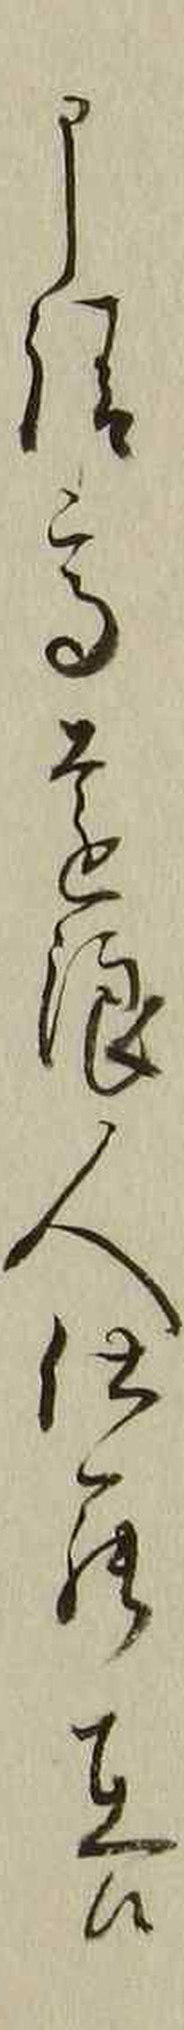申請高遠浪人仕罷在候
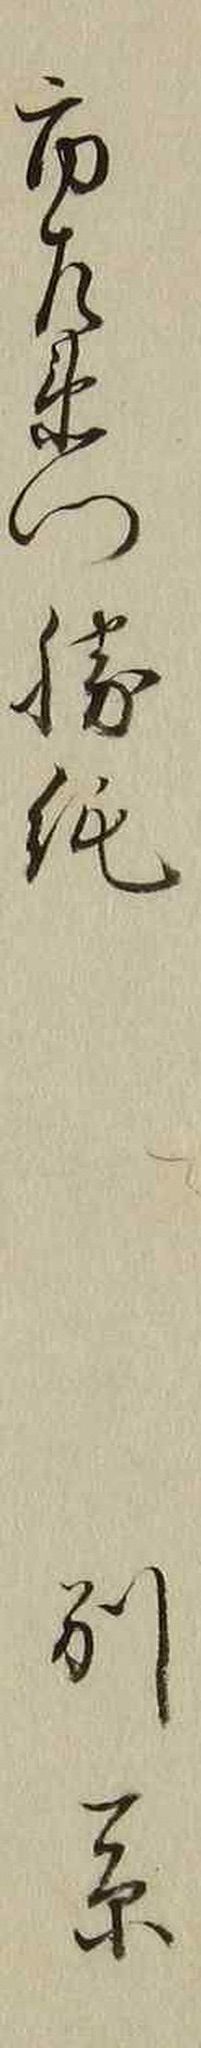市左衛門勝純別系
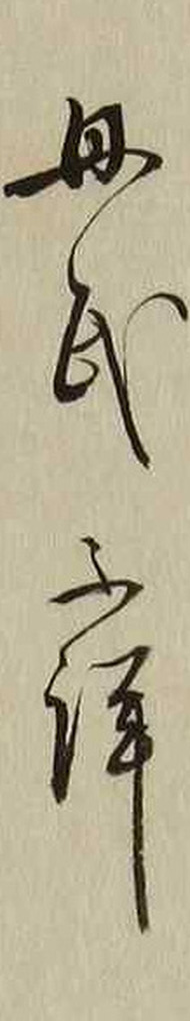母氏不詳
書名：諸士系譜　巻之2　い之部2
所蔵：会津若松市立会津図書館
